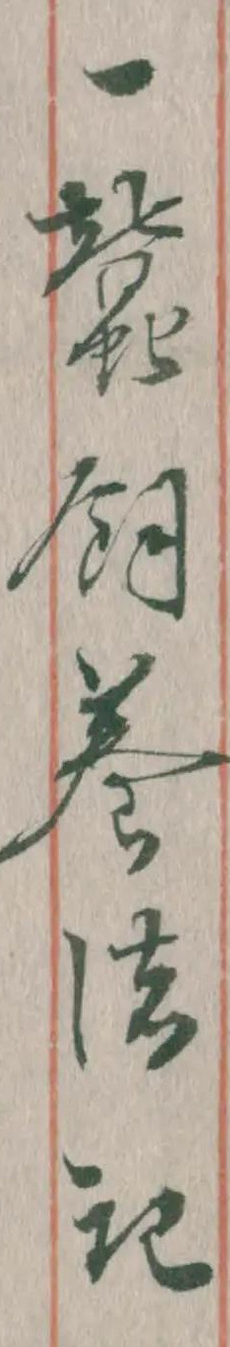一蚕飼養方法記

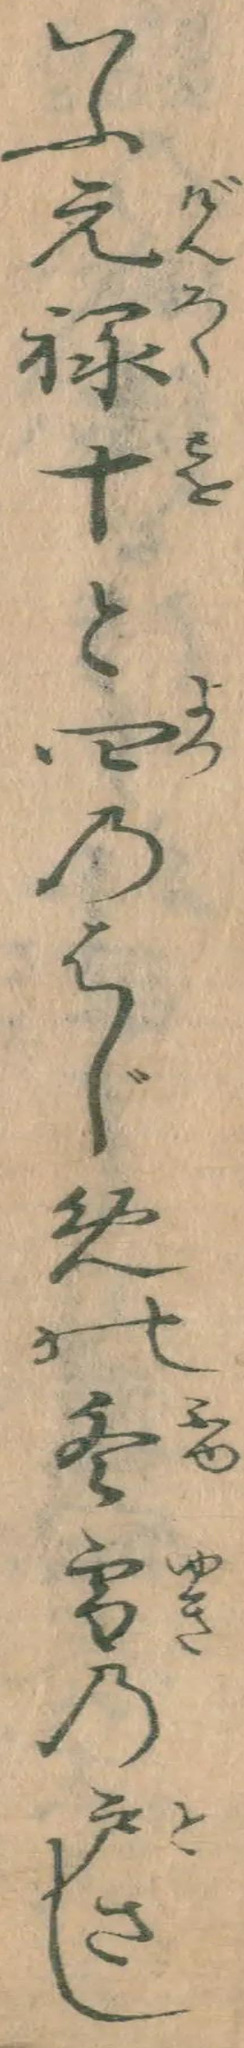いふ元禄十と四のはじめの冬雪の戸さし
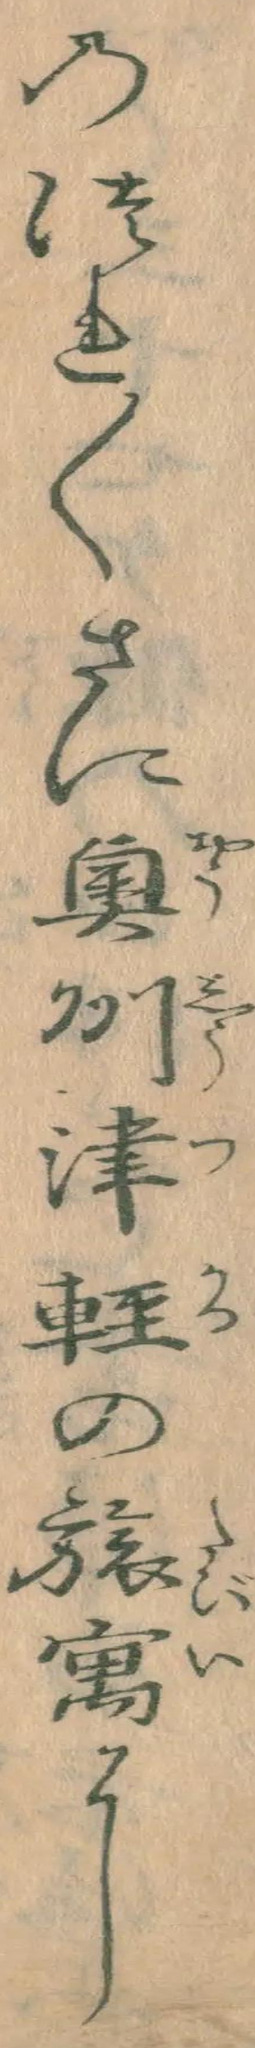のつれ〳〵さに奥州津軽の旅寓に
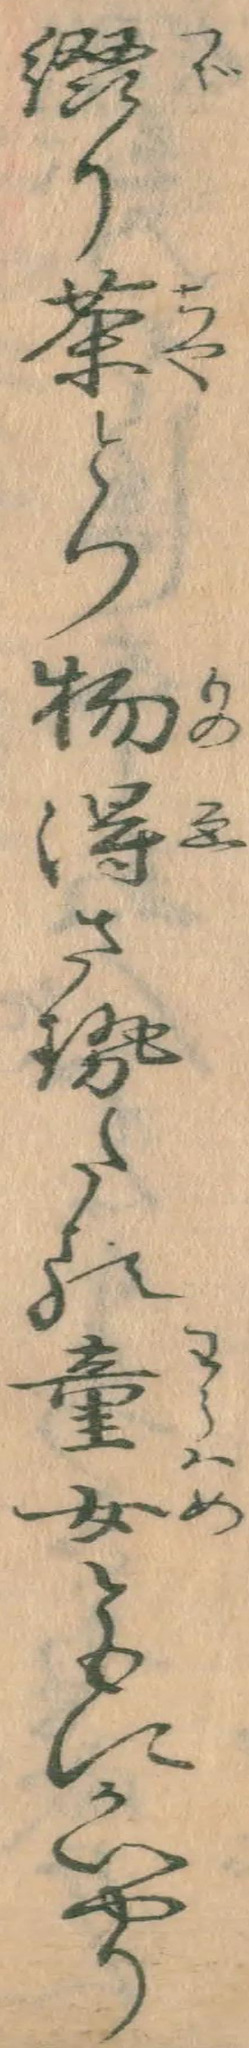綴り茶とり物得させたる童女ともにかいやり
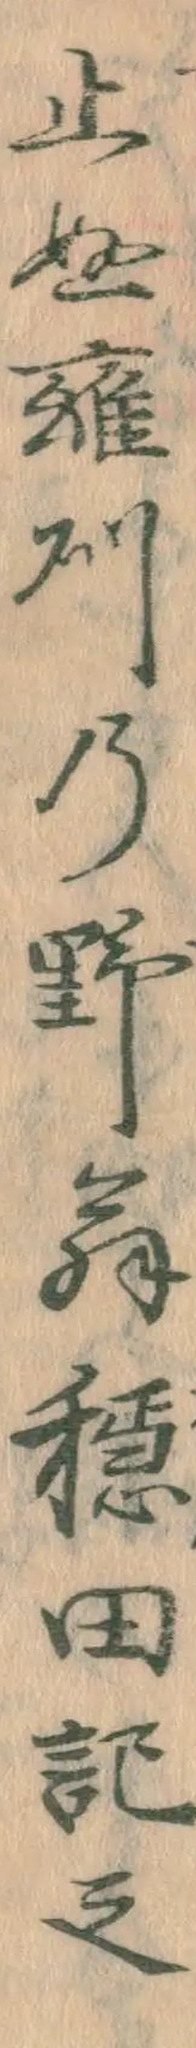止ぬ雍州の野翁穏田記之
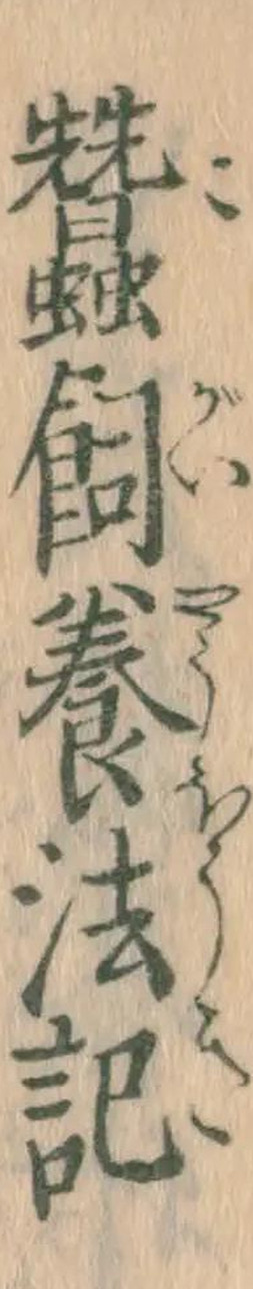蠶飼養法記
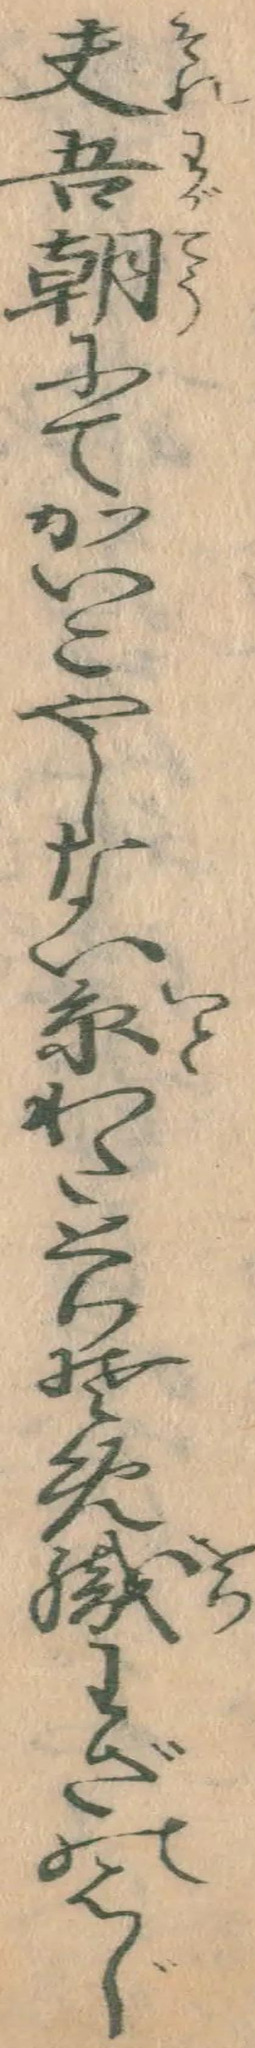夫吾朝にてかいこやしない糸わたとりそめ織わざのはじ
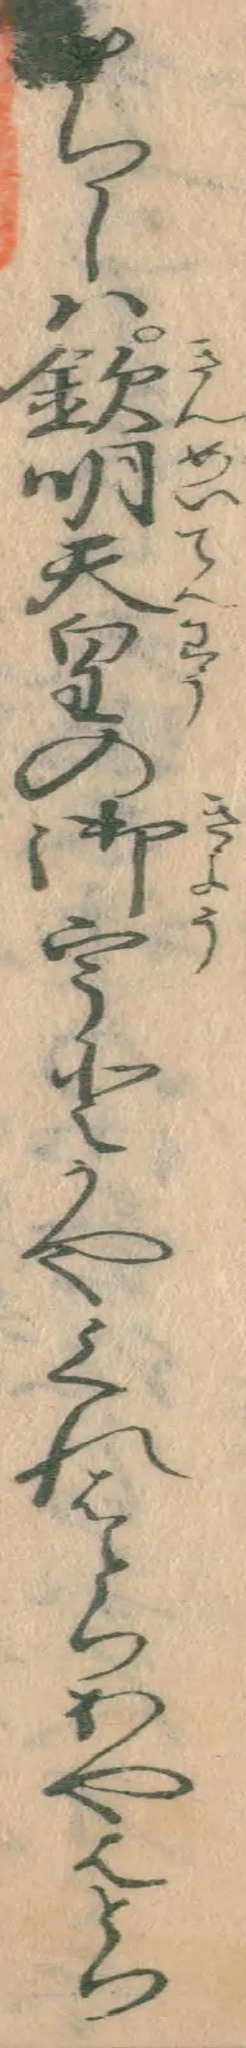りしは。欽明天皇の御宇とかやくれはとりあやはとり
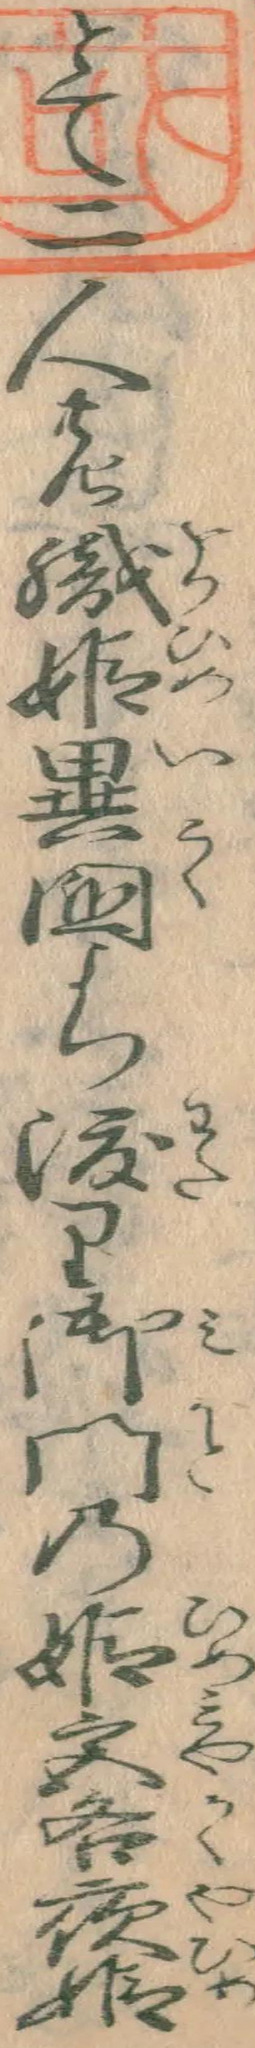とて二人の織姫異国より渡り御門の姫宮各夜姫
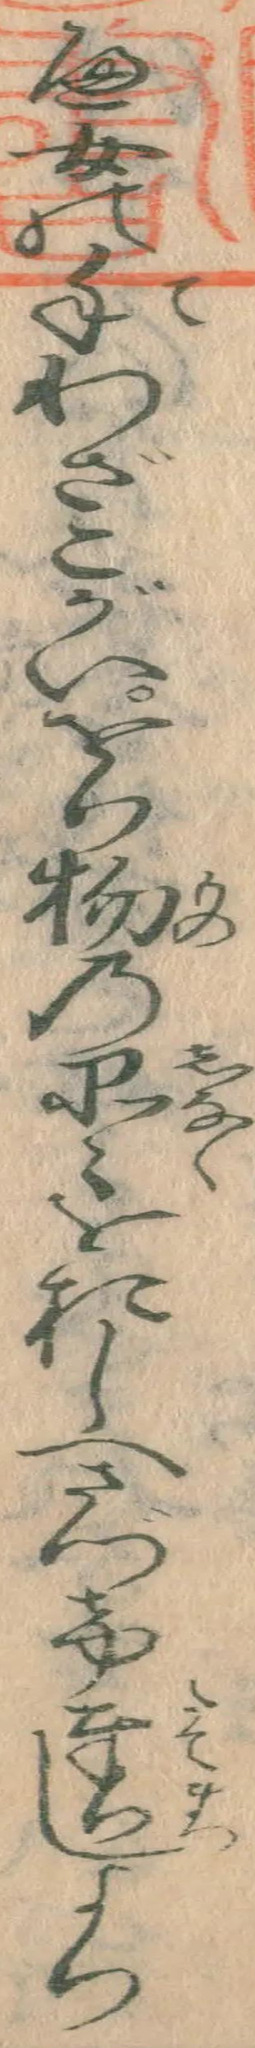ヘ女の手わざこがい。をり物の品々をおしへさつけ奉りしより
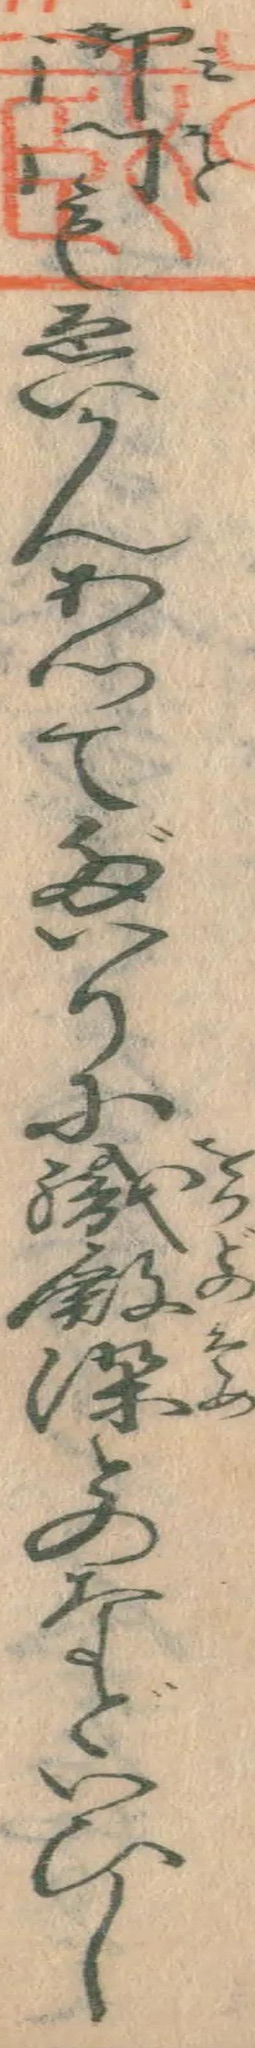御門もゑいかんあつてだいりに織殿染とのなどいひし
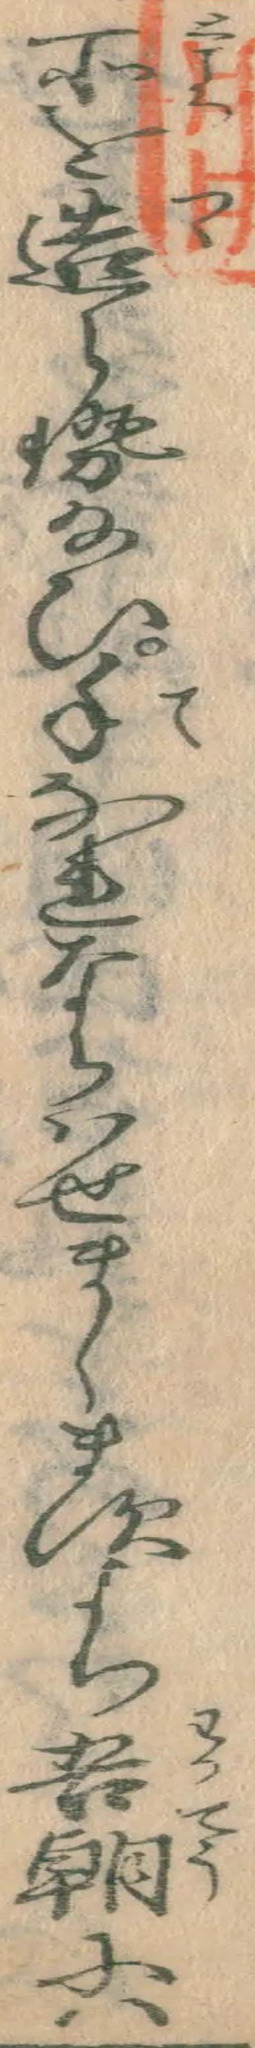所を造らせ給ひ。手なれならはせましますより吾朝には
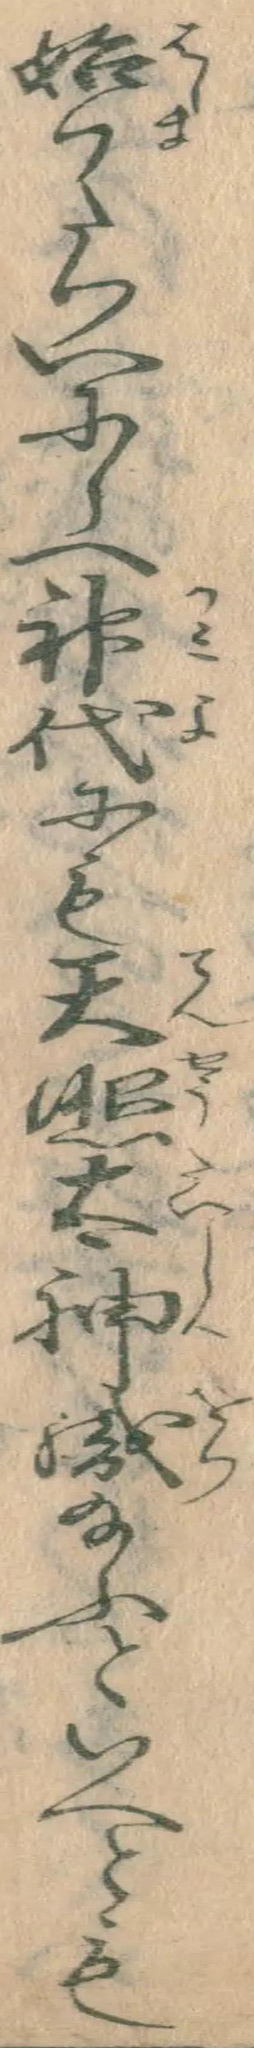始りたりいにしへ神代にも天照太神織給ふといへとも
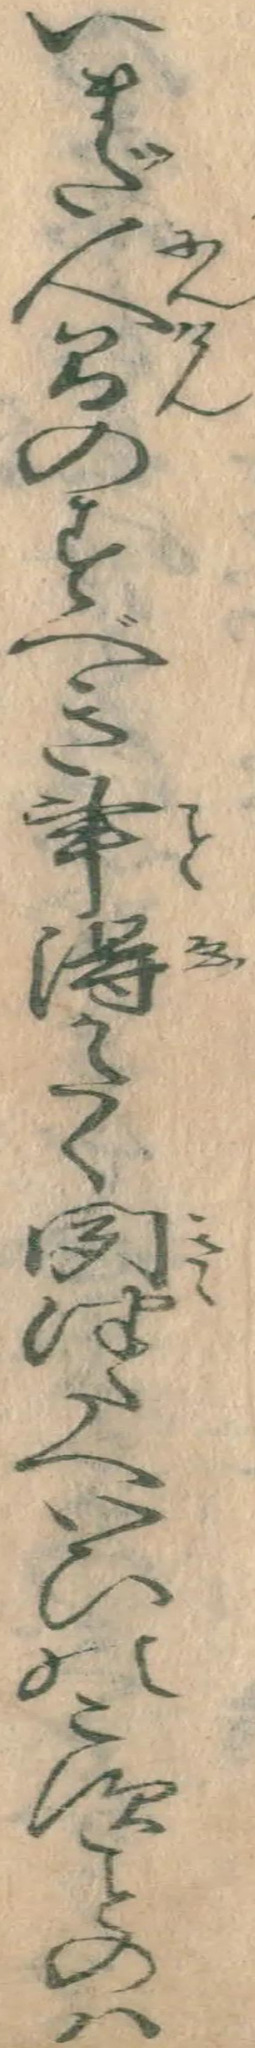いまだ人間のすべさ事得かたく聞つたへいひのこすことのは
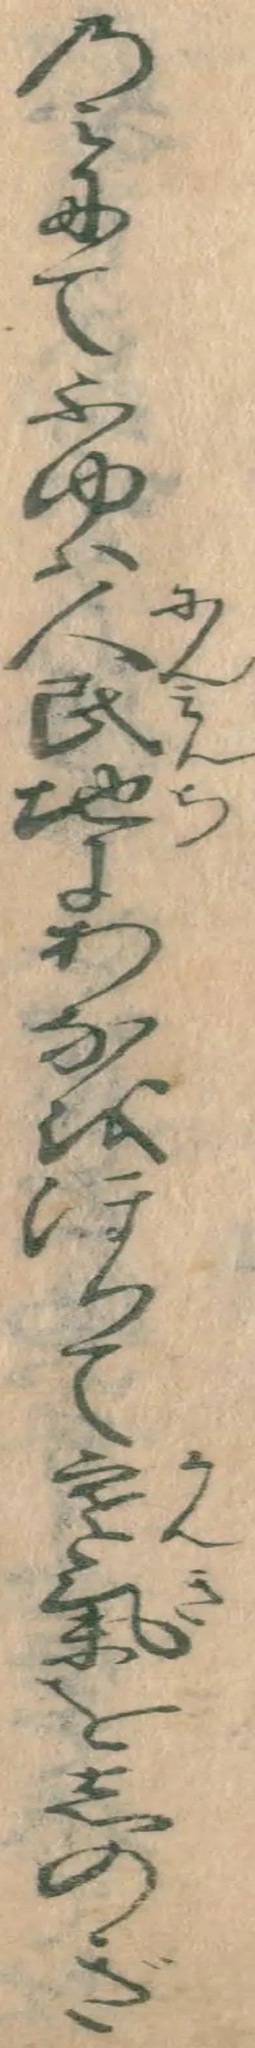のみにてふゆは人民地にあなをほりて寒気をしのぎ

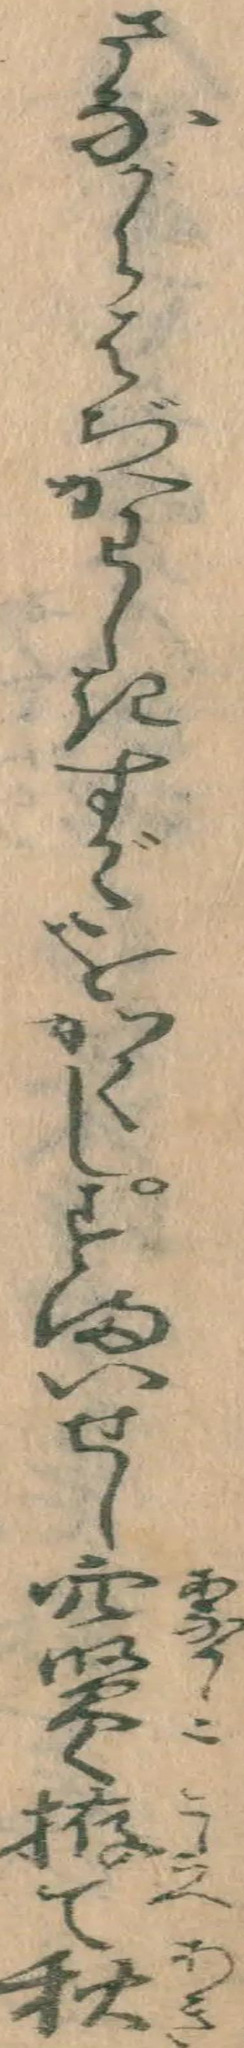さなからはぢかわしきすがたをかくし。すまいせし穴賢く拵て秋
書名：蚕飼養法記
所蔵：国立国会図書館 National Diet Library, JAPAN
